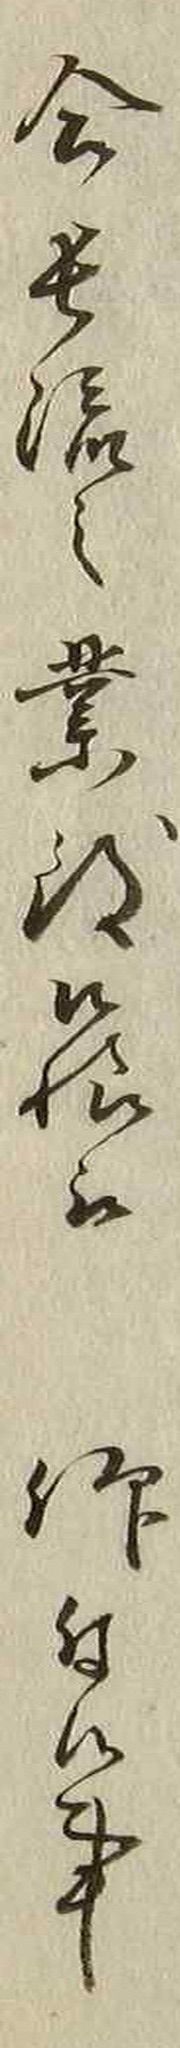合長流之業致候様被仰付候事
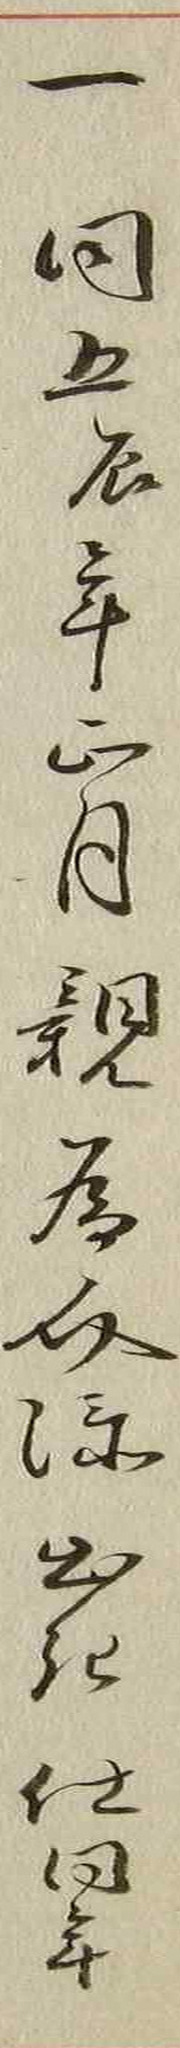一同五辰年正月親為介添出起仕同年
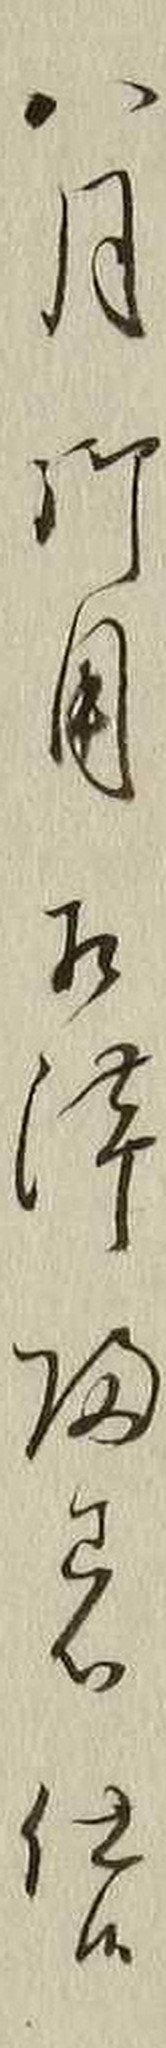八月御用相済帰着仕候
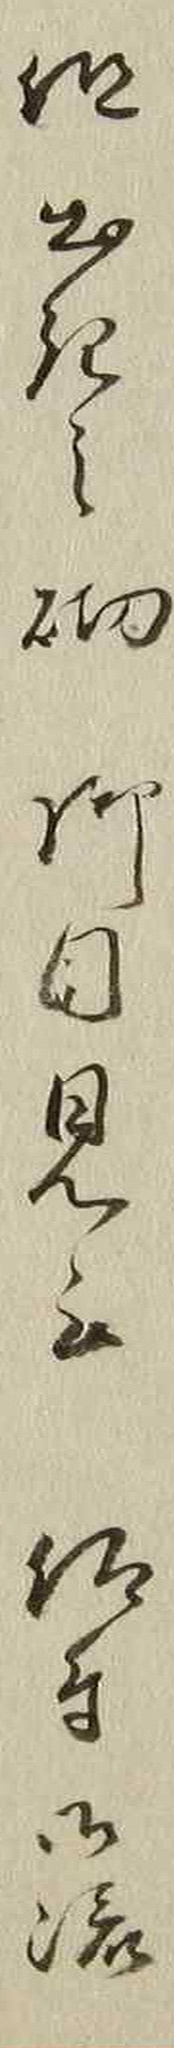但出起之砌御目見被仰付御流
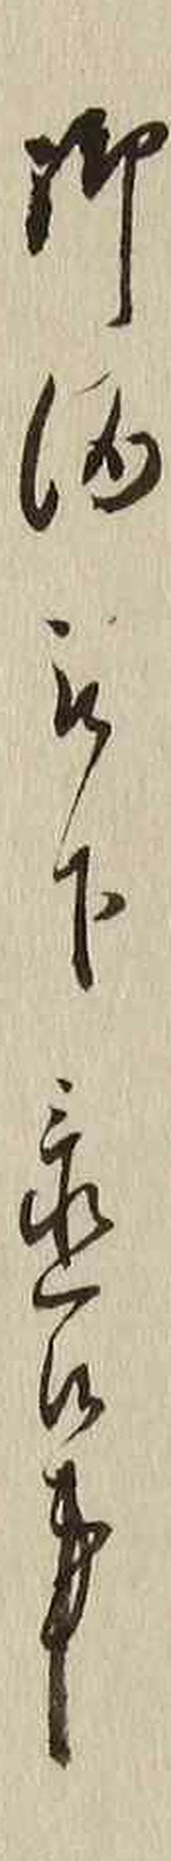御酒被下置候事
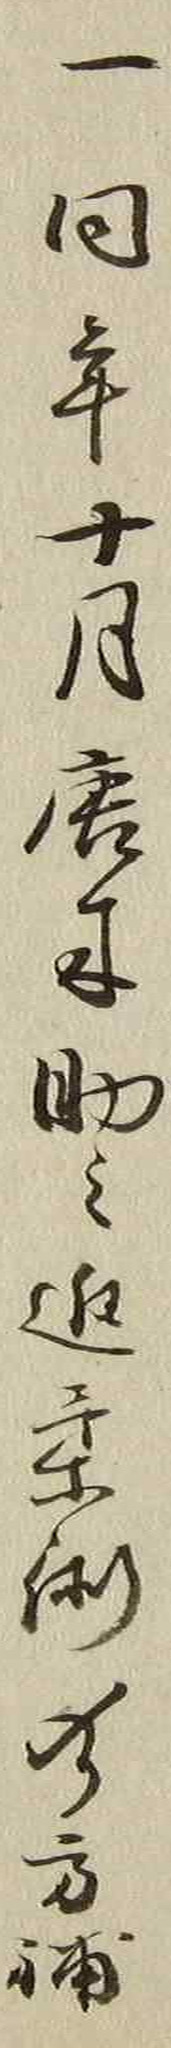一同年十月唐木助之進柔術〆り方補
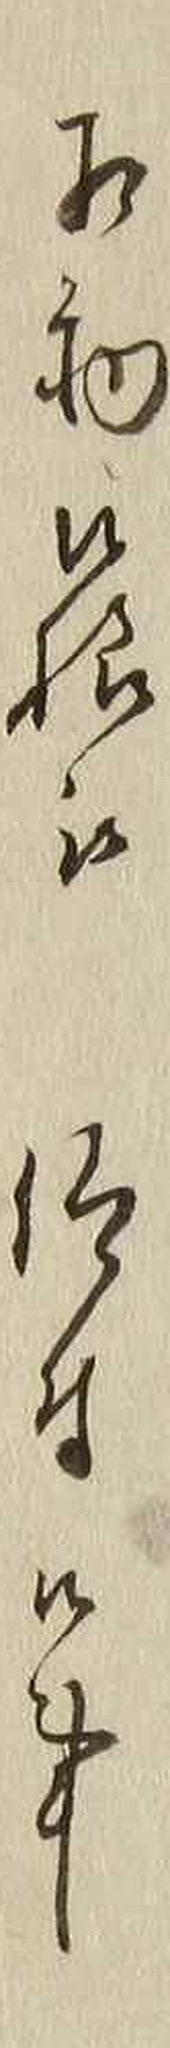相勤候様被仰付候事
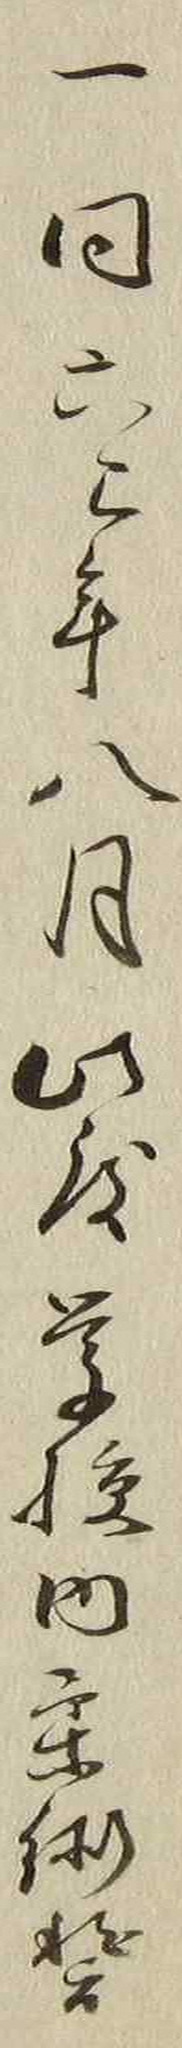一同六巳年八月此度学授内柔術稽
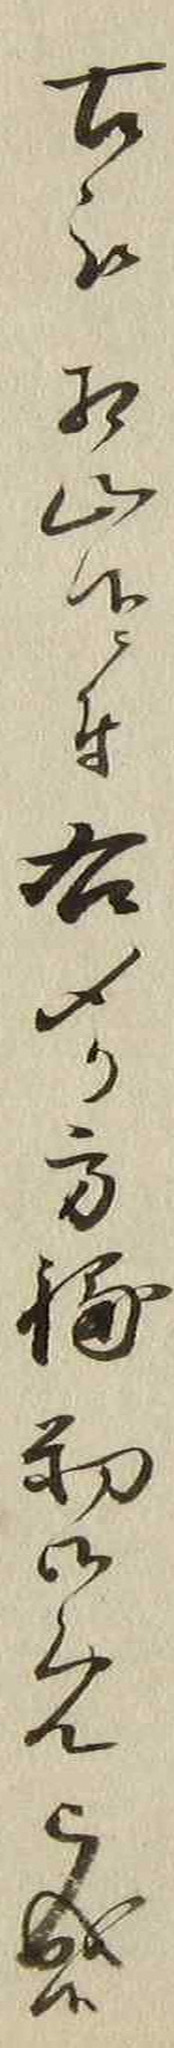古被相止候ニ付右〆り方補勤御免被成候
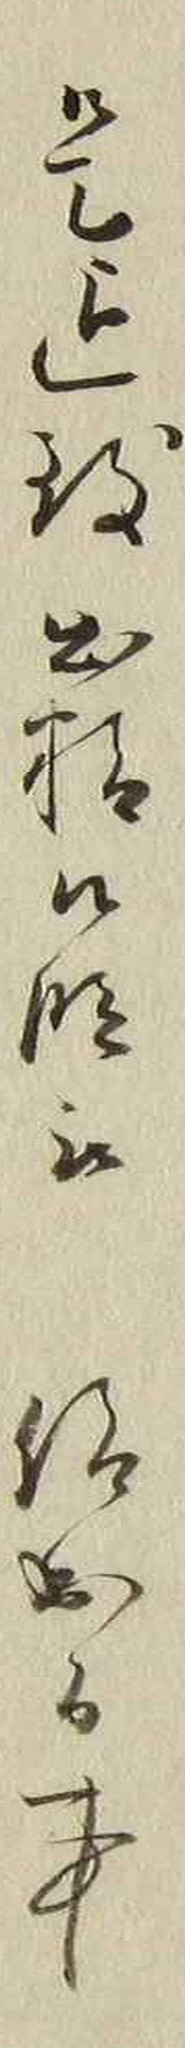是迄致出精候段被仰出候事
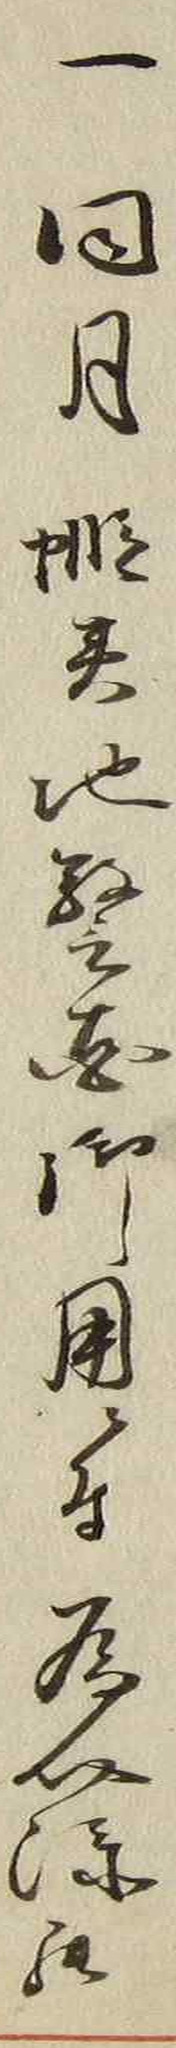一同月蝦夷地警固御用ニ付為介添罷
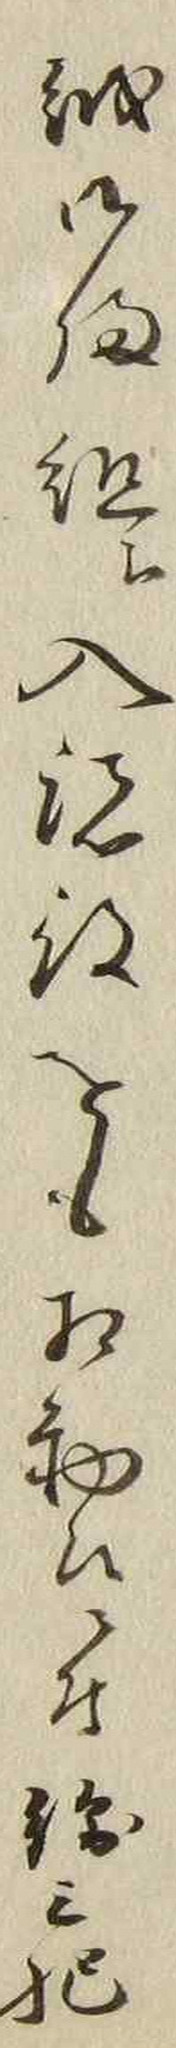越候帰組江入諸役をも相勤候ニ付綿三把
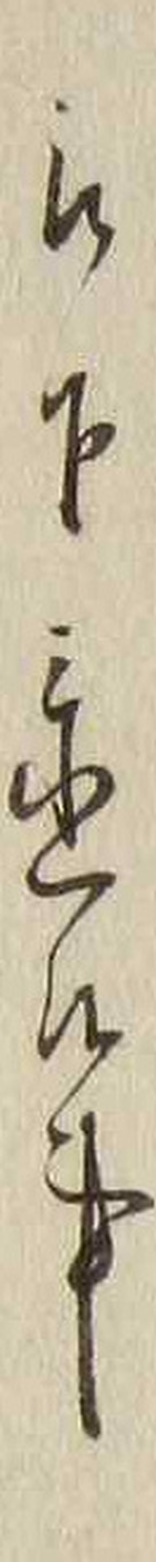被下置候事
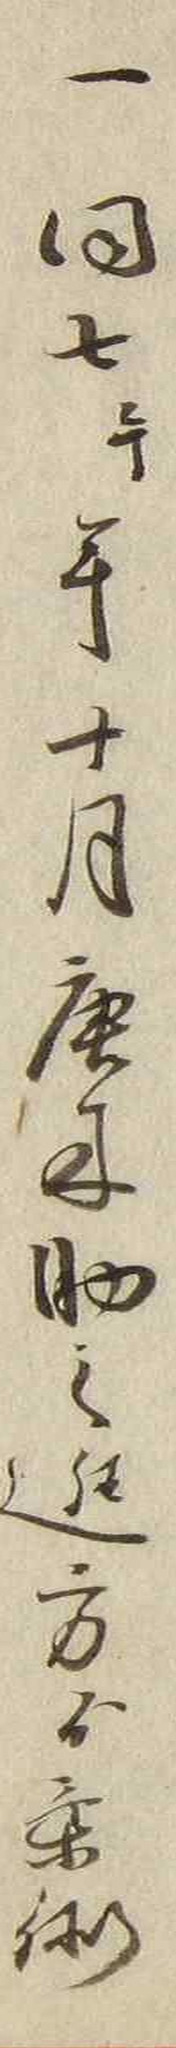一同七午年十月唐木助之進方ゟ柔術

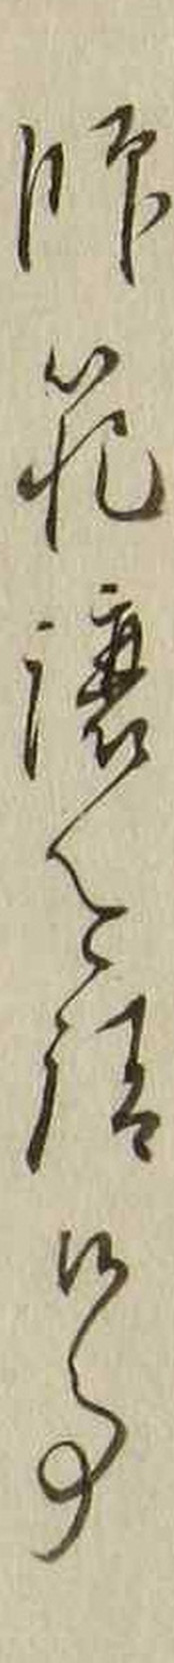師範譲を請候事
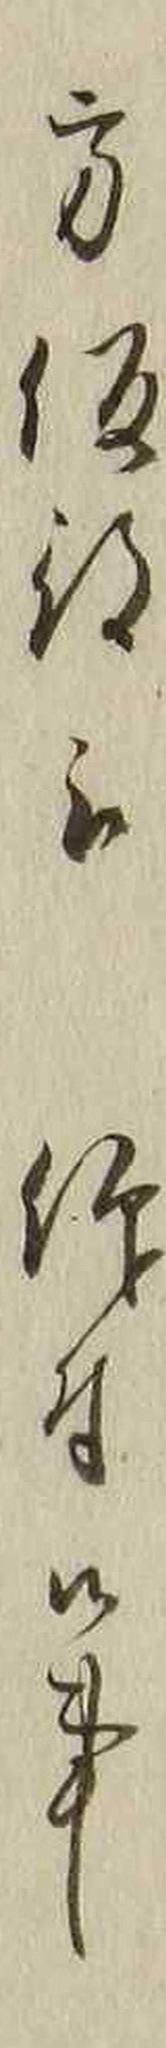方仮役被仰付候事
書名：諸士系譜　巻之25　い之部25
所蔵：会津若松市立会津図書館
